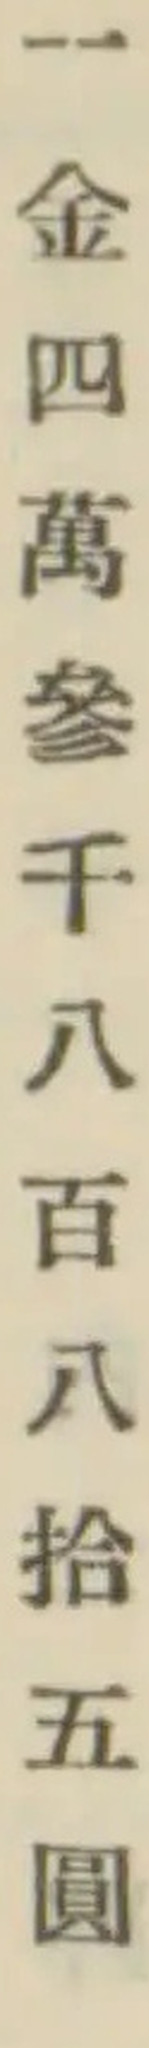一金四萬參千八百八拾五圓
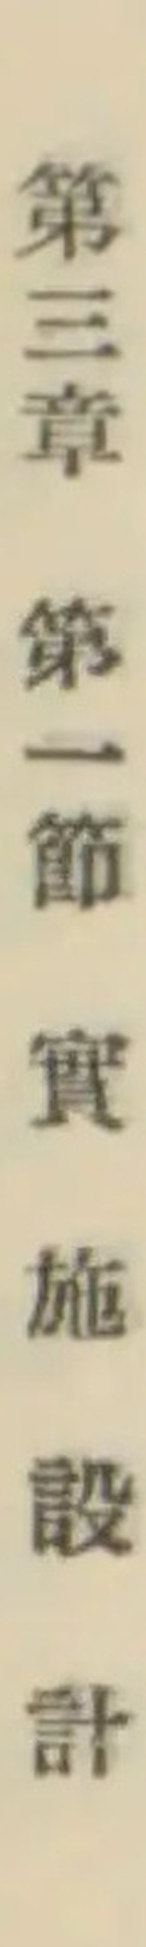第三章第一節実施設計

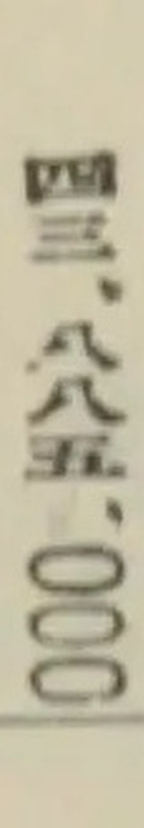計四三、八八五、〇〇〇
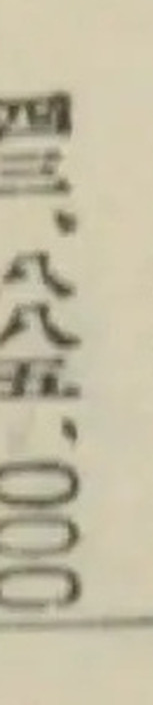計四三、八八五、〇〇〇
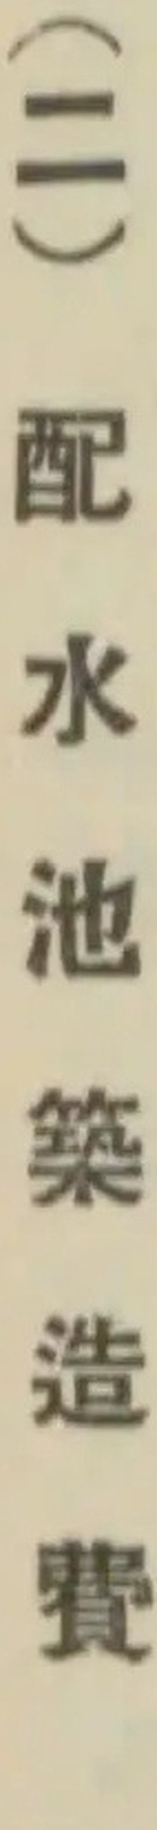(二)配水池築造費
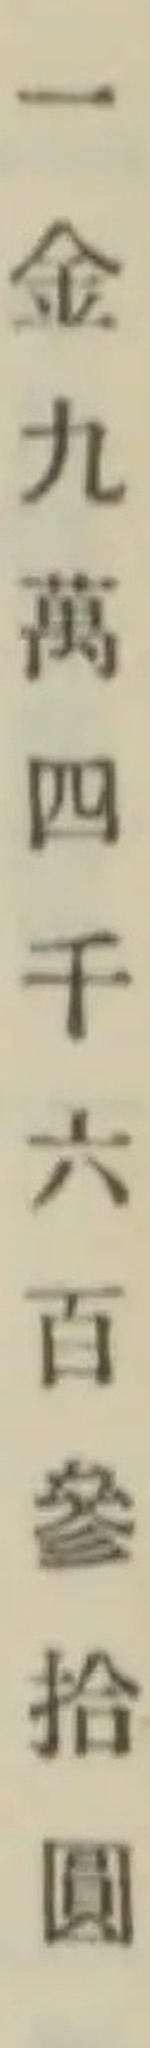一金九萬四千六百參拾圓

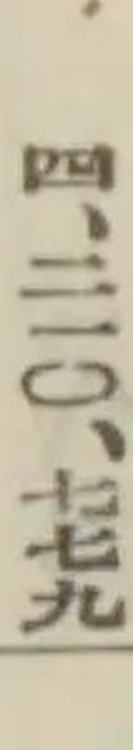雑工四、二〇、七七九
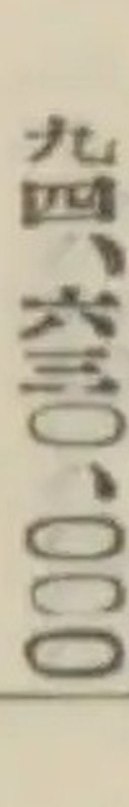計九四、六三〇、〇〇〇
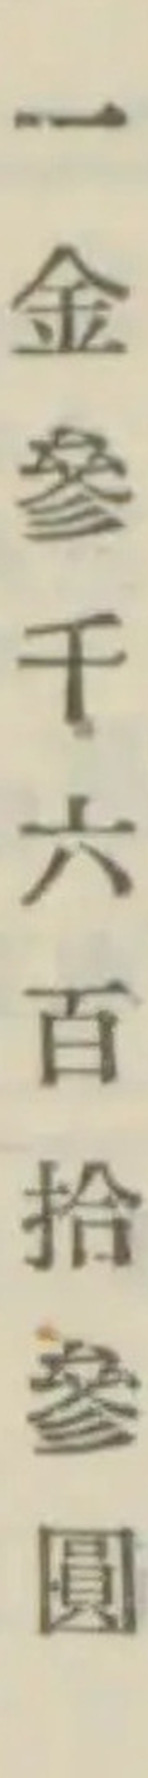一金三參千六百拾參圓
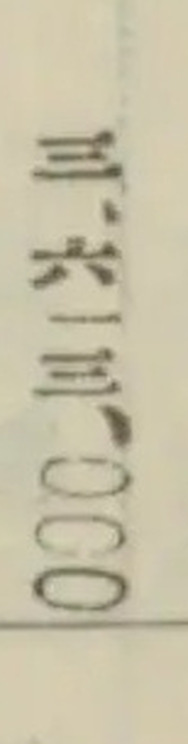計三、六一三、〇〇〇
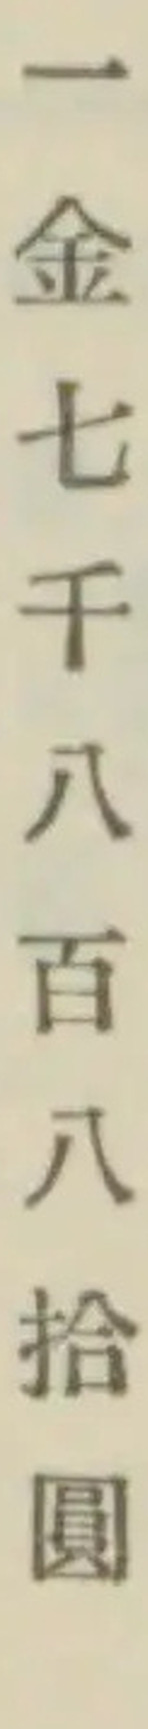一金七千八百八拾圓
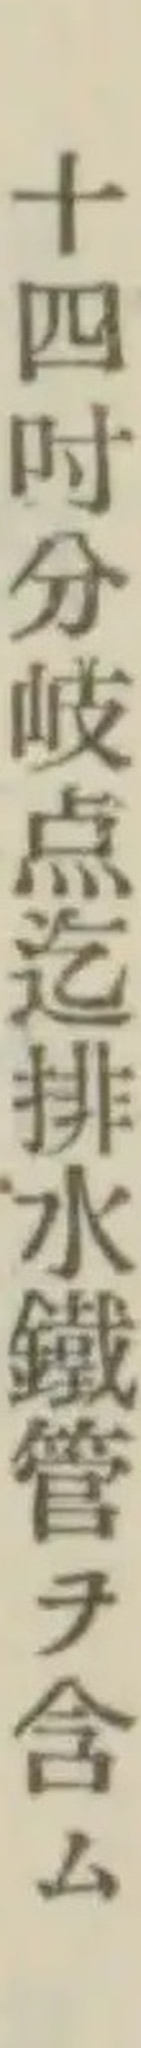内譯十四吋分岐点迄排水鐵管を含む

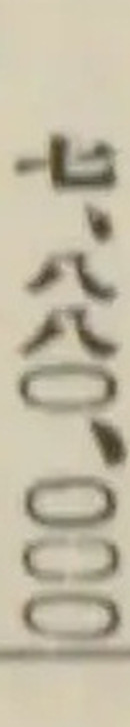計七、八八〇、〇〇〇
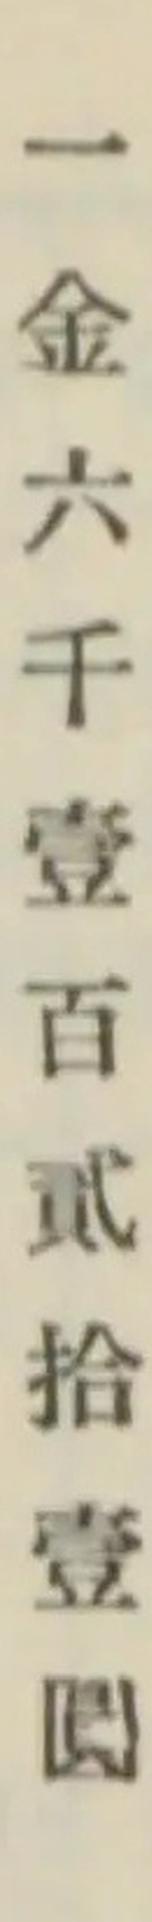一金六千壹百貳拾壹圓
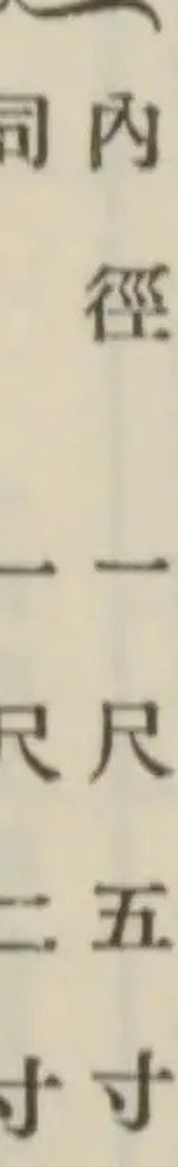内径一尺五寸
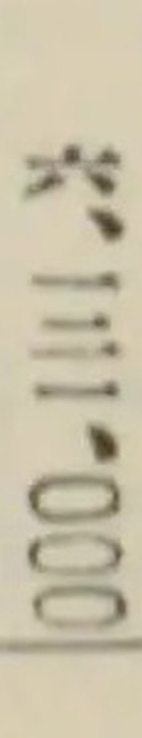計六、一二一、〇〇〇
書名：豊橋市水道誌
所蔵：国立国会図書館 National Diet Library, JAPAN
